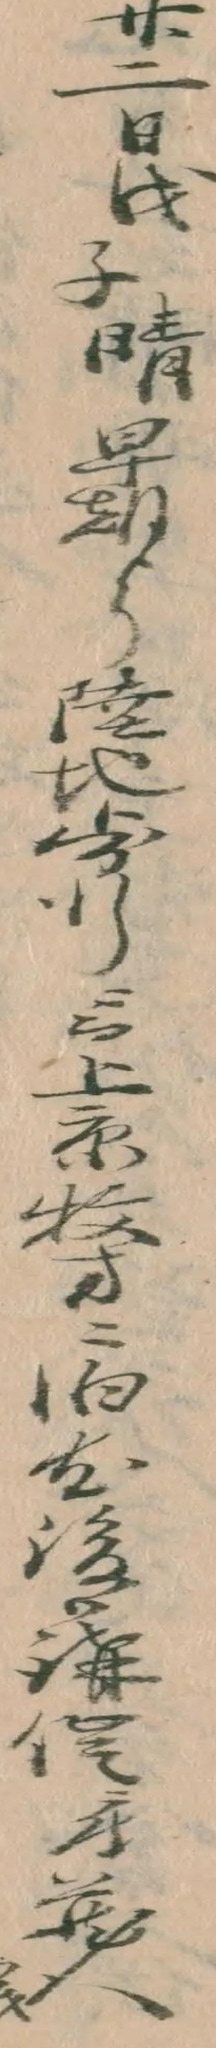廿二日戊子晴早朝より陸地歩行ニ而上京牧方ニ泊出後御講催ニ付蔵人義
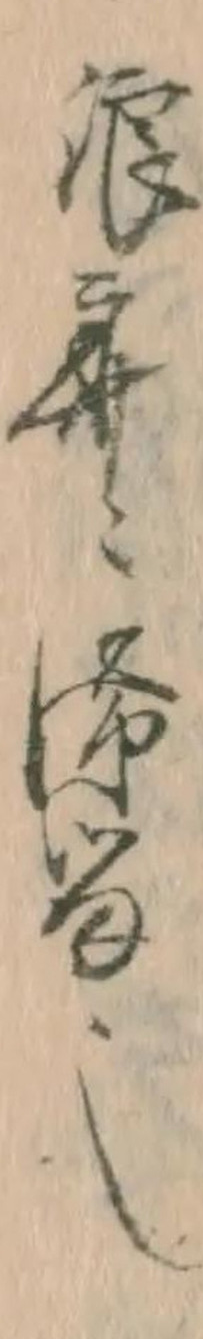浪ニ滞留也
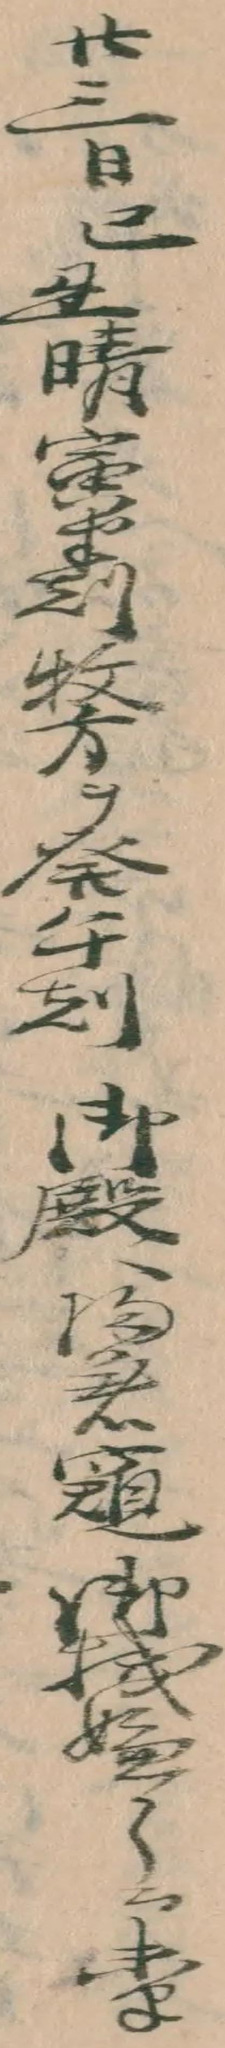廿三日己丑晴寅半刻牧方ヲ発午刻御殿へ帰着窺御機嫌了而未半
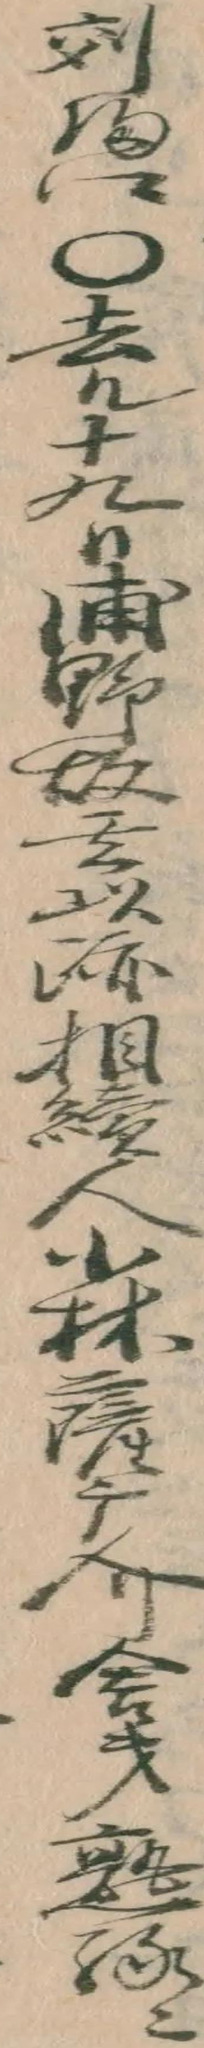刻帰卿○去ル十九日浦野故玄以跡相續人小林薩摩介舎弟熟詠ニ
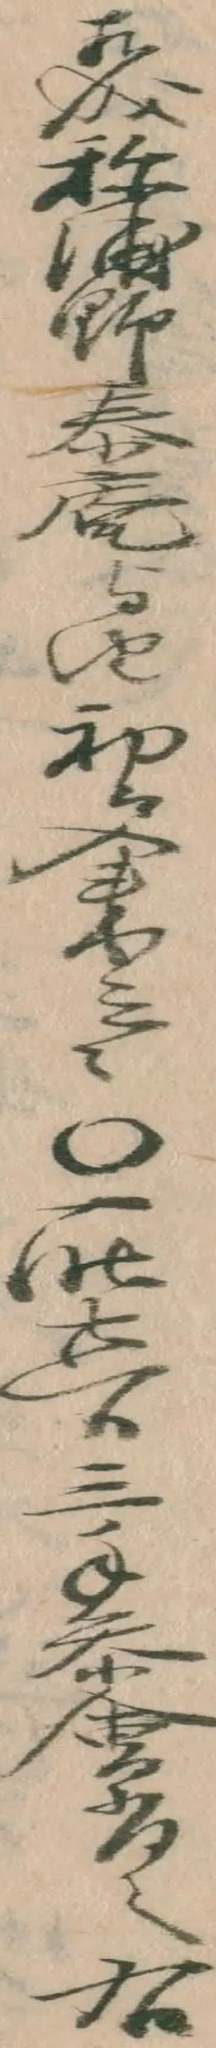相成称浦野泰庵与由初而入来云々○一昨廿一日三手参會有之右
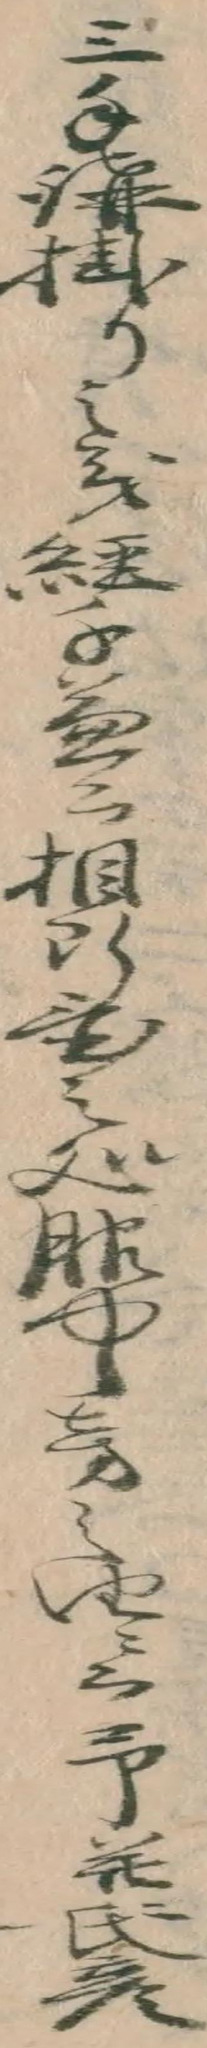三手講掛り之義経千兼而相断置之処服中旁之由ニ而予并氏彦
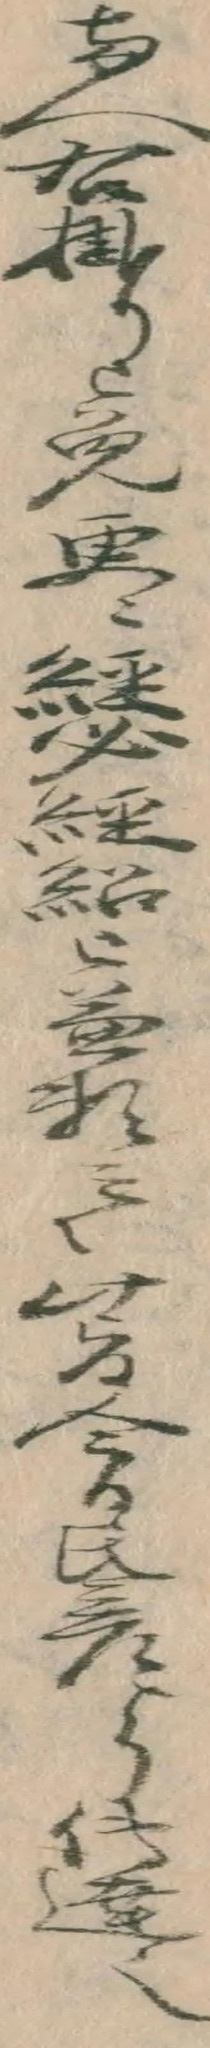両人右掛り被免更ニ経必経と紹御兼頼云々此旨今日氏彦より伝達也
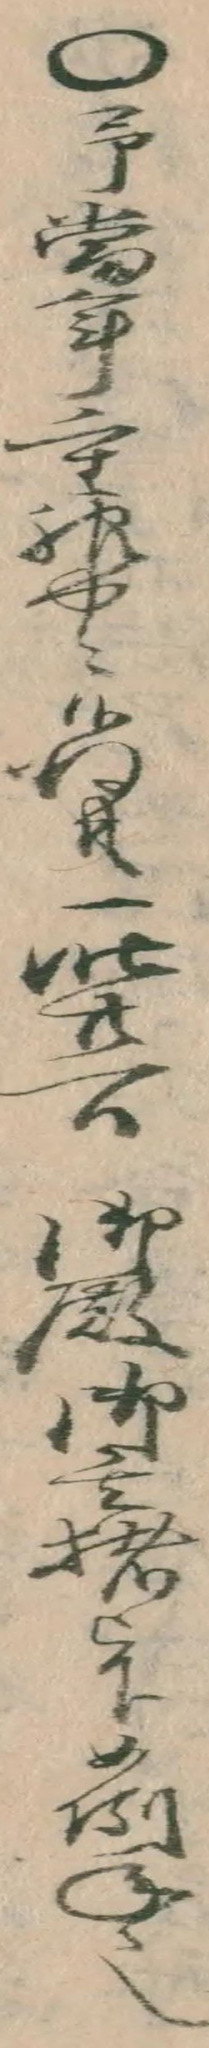○予當年重服中ニ候得共一昨廿二日御殿御玄猪被下如例年也
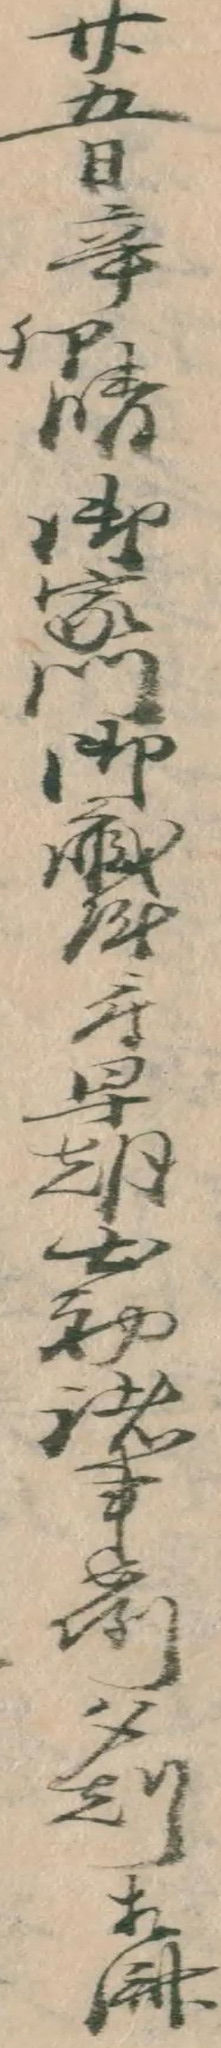廿五日辛卯晴御家門御蔵附ニ付早朝出勤諸事如例夕刻相済
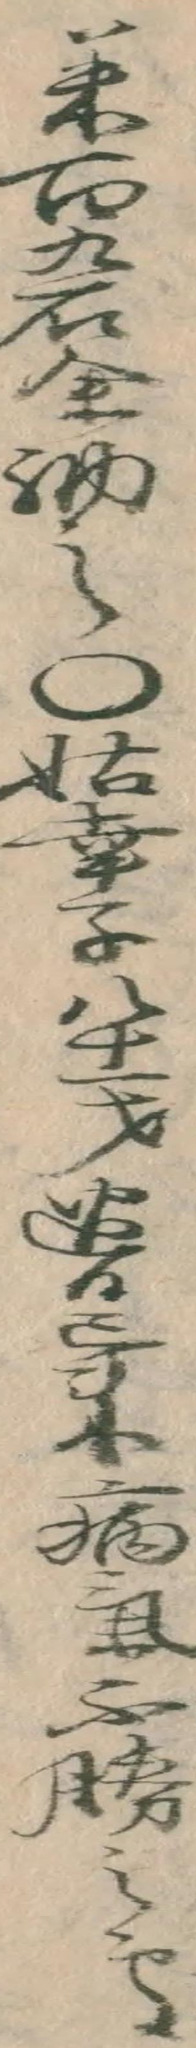米百九石余納了〇姑幸子八十一才過日已来病氣不勝之處
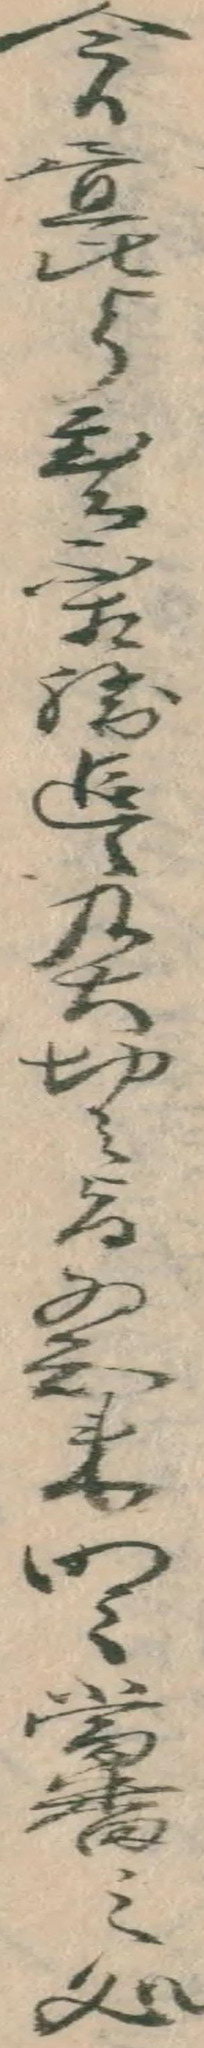今日昼比より至而不相勝追々及大切之旨為知来仍之當番之処
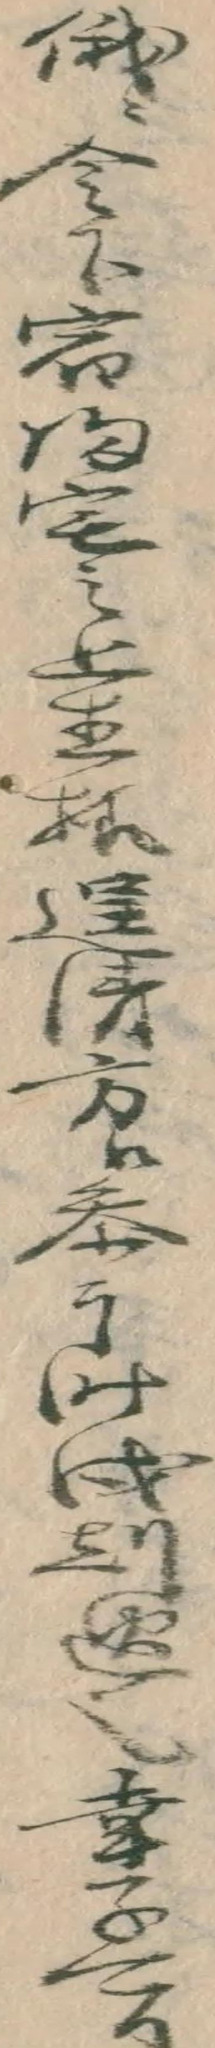俄ニ令下宿帰宅之上直様逞清方江参于時戌刻過也幸子今日
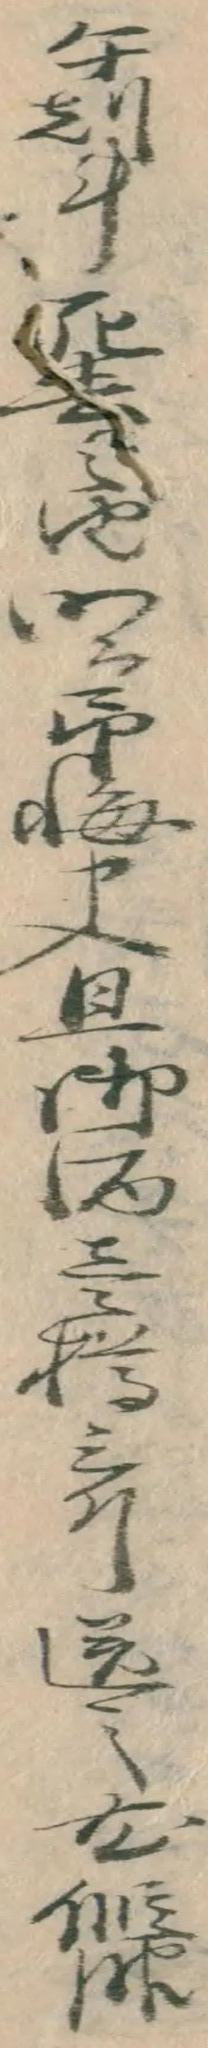午刻斗死去之由仍而弔悔申入且御酒壱樽三斤送之尤仮服
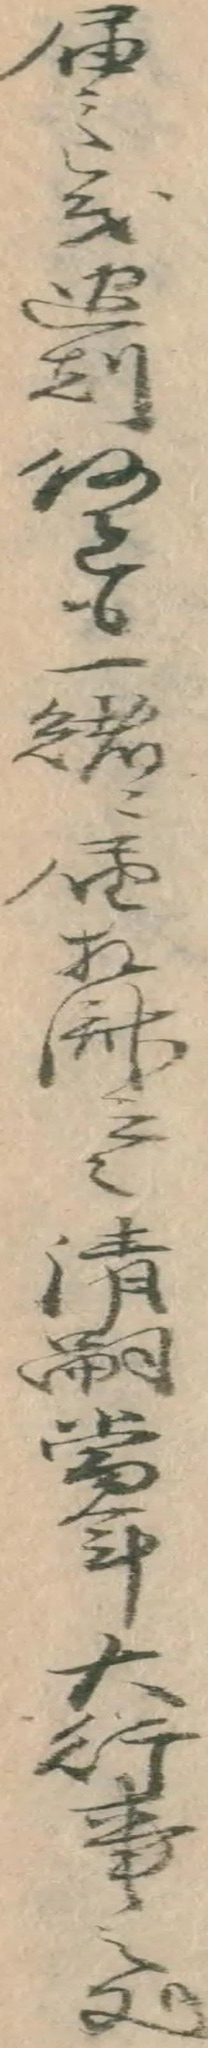届之義過刻何とも一緒二届相済云々清嗣當年大行事之処

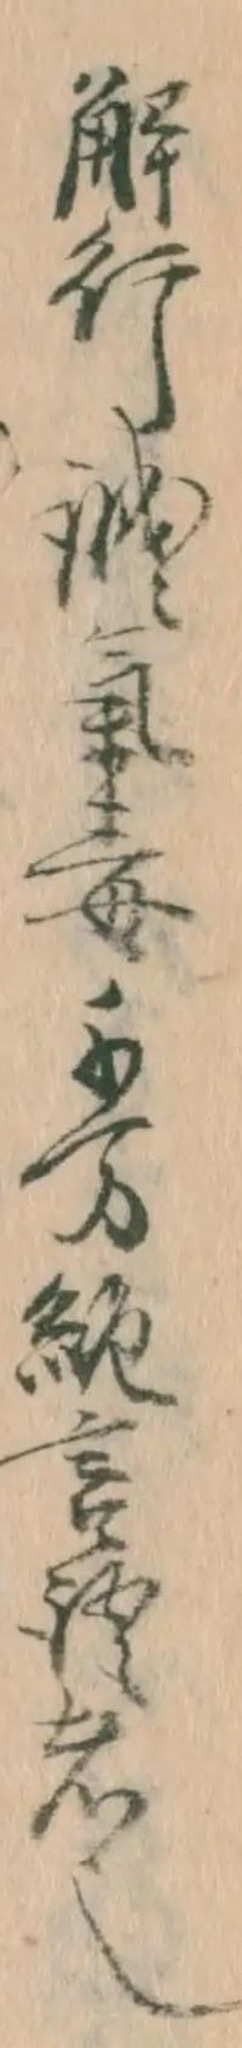解行誠ニ氣毒千万絶言語者也
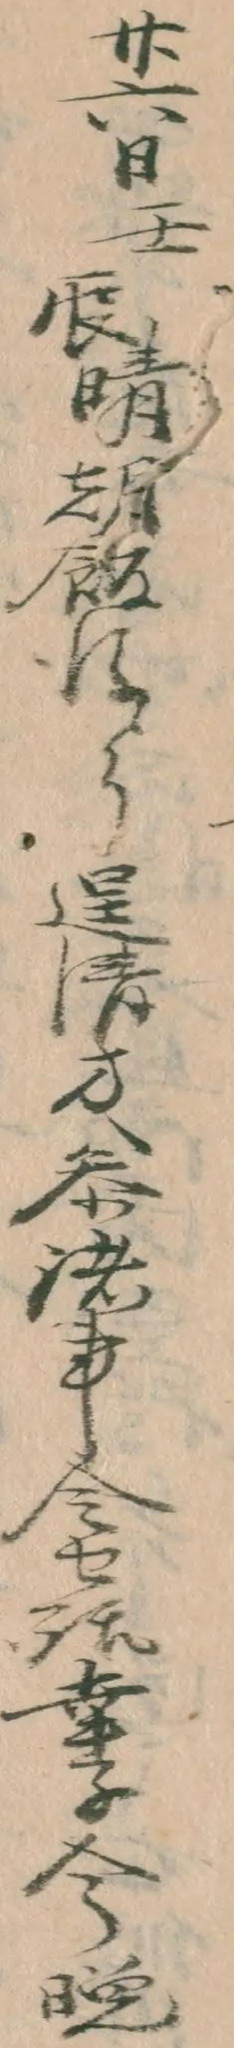廿六日壬辰晴朝飯後より逞清方へ参諸事令世話幸子今晩
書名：賀茂社記録. 第65冊
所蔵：国立国会図書館 National Diet Library, JAPAN
